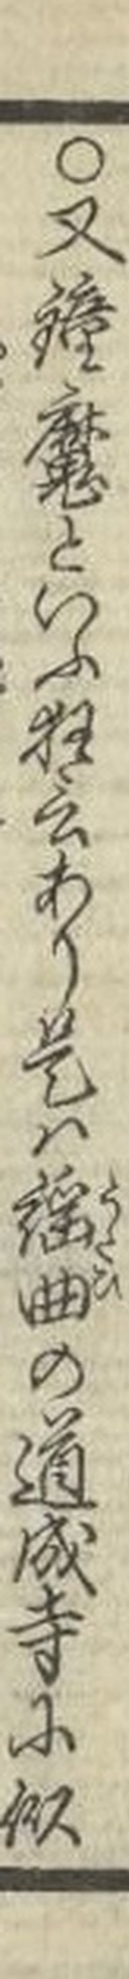○又鐘魔といふ狂言あり是は謡曲の道成寺に似
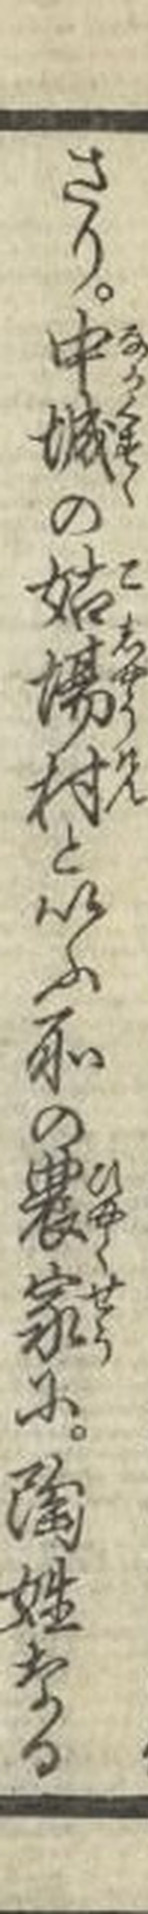さり。中城の姑場村といふ所の農家に。陶姓なる
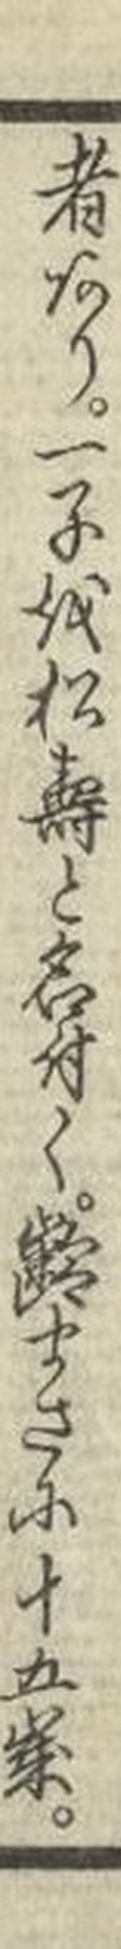者あり。一子を松寿と名付く。齢まさに十五歳。
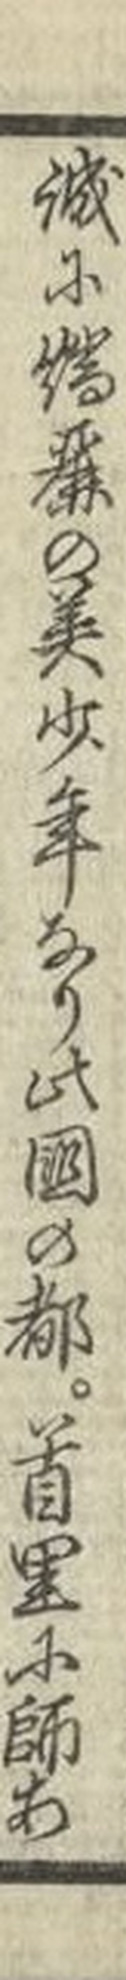誠に端麗の美少年なり此国の都。首里に師あ
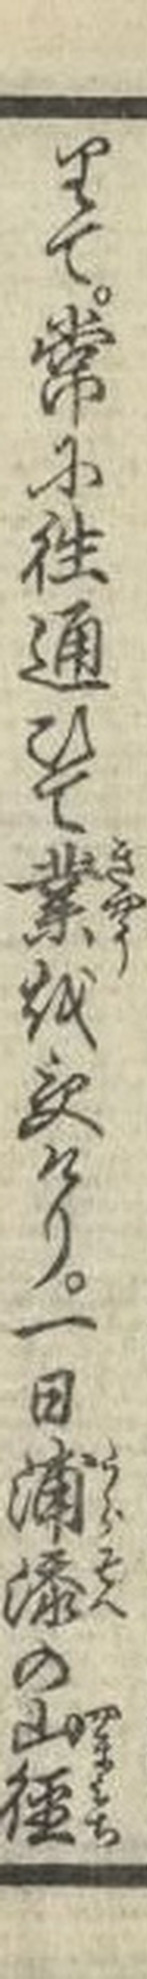りて。常に往通ひて業を受けり。一日浦添の山径
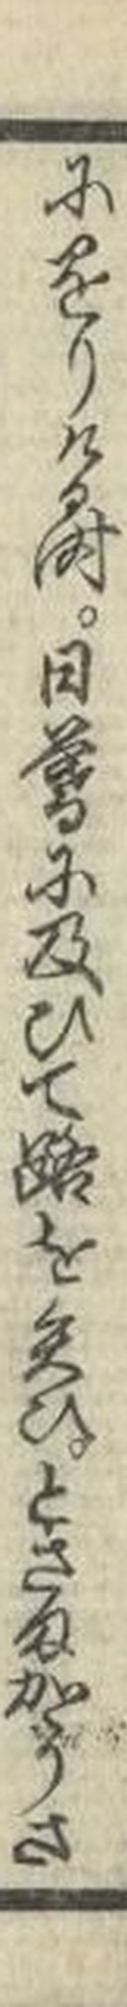に懸りける時。日暮に及ひて路を失ひ。とさまかうさ
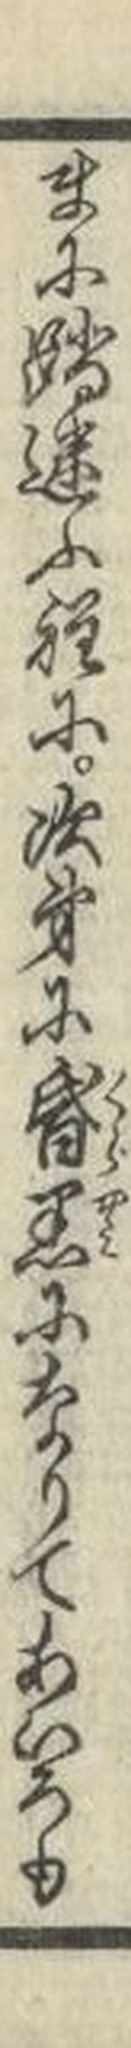まに踏迷ふ程に。次第に昏黒になりてあいろも
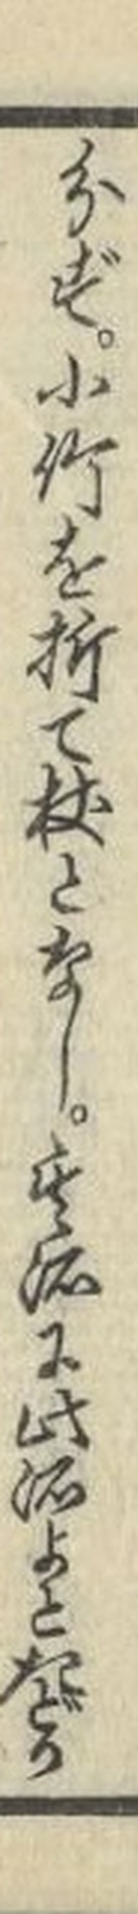分ず。小竹を折て杖となし。其所に此所よとたどり
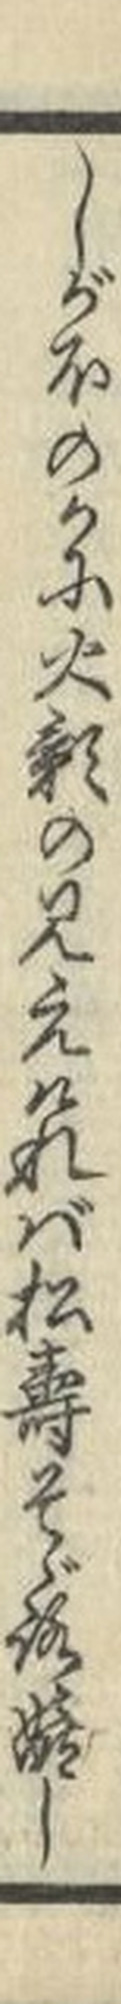しがほのかに火影の見えければ松寿そゞろ嬉し
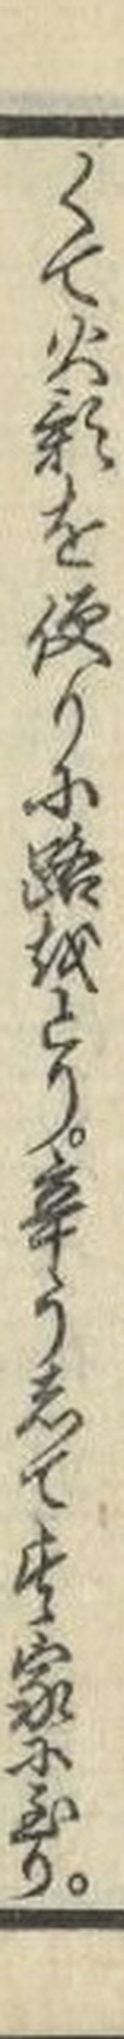くて火影を便りに路をとり。辛うして其家に至り。
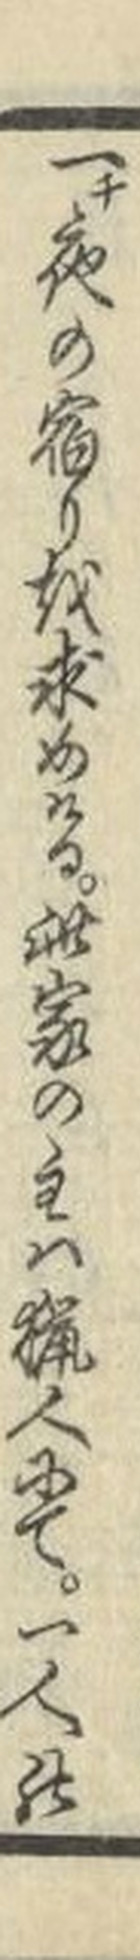一チ夜の宿りを求めける。此家の主は猟人にて。一人の
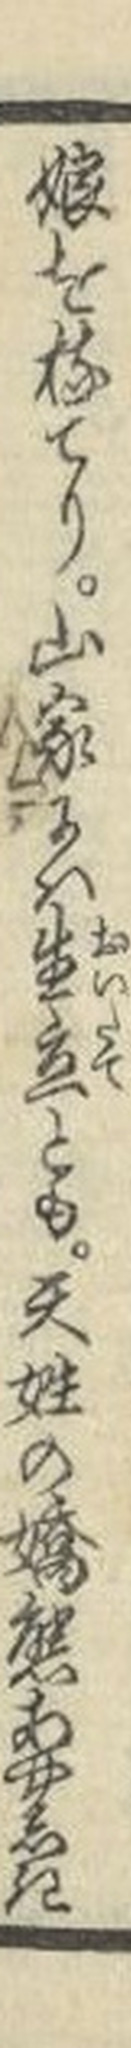娘を持てり。山家には生立とも。天姓の嬌態あやしき
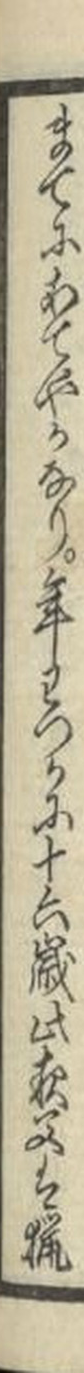まてにてあてやかなり。年わつかに十六歳此夜父は猟
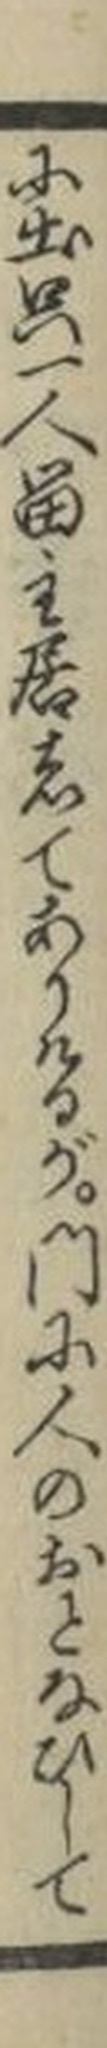に出只一人留主居してありけるが。門に人のおとなひして
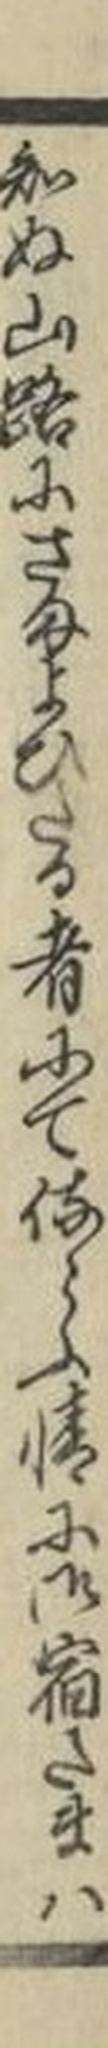知ぬ山路にさまよひたる者にて侍らふ情に御宿たまは
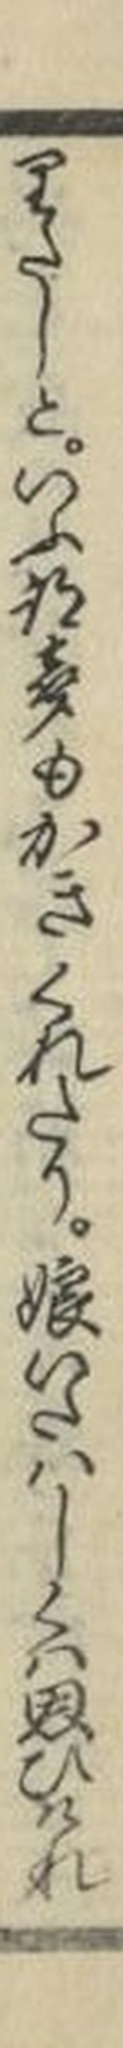りたしと。いふ跡声もかきくれたり。娘いたはしくは思ひけれ
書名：琉球解語
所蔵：University of the Ryukyus Library
